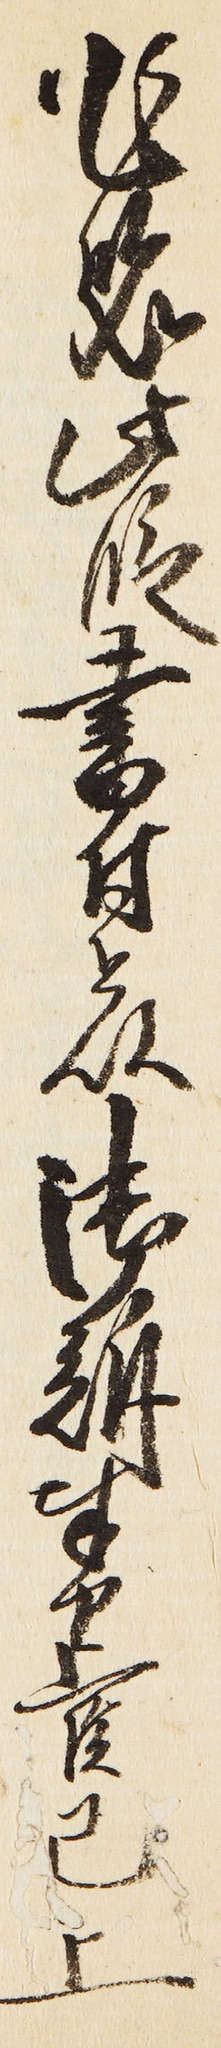乍恐此段書付を以御訴奉申上候已上
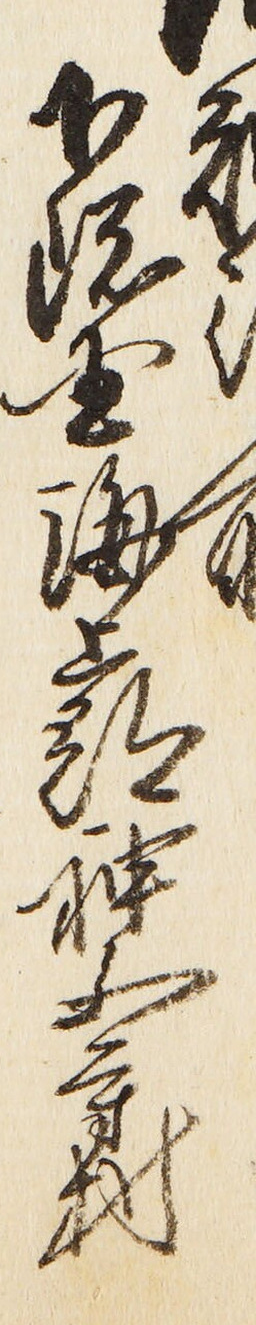下総国海上郡神宮寺村
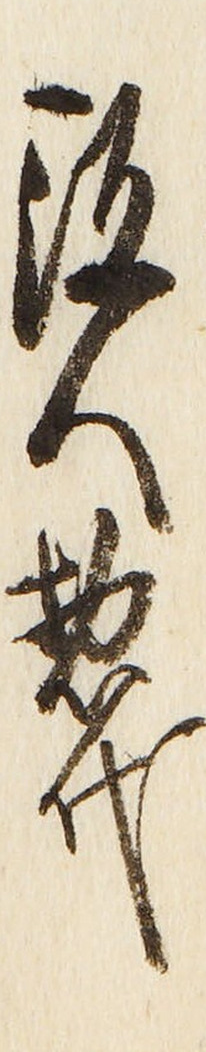役人惣代
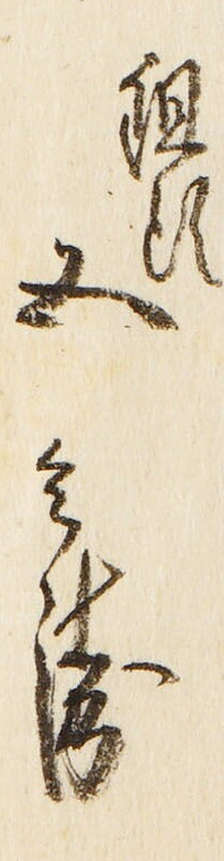組頭五兵衛
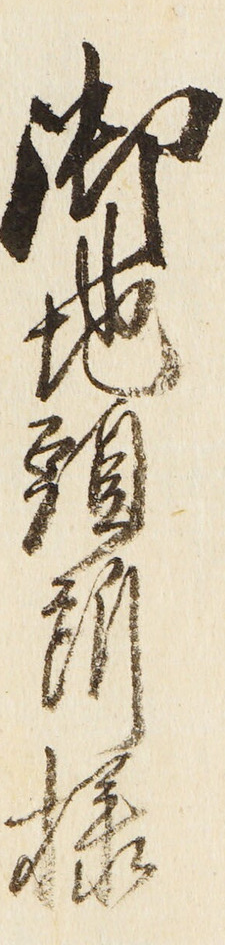御地頭所様
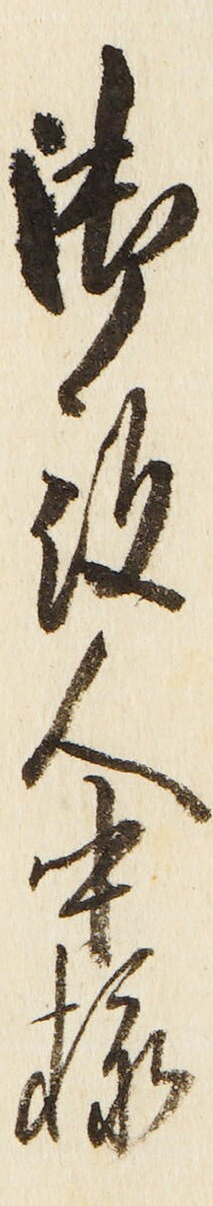御役人中様

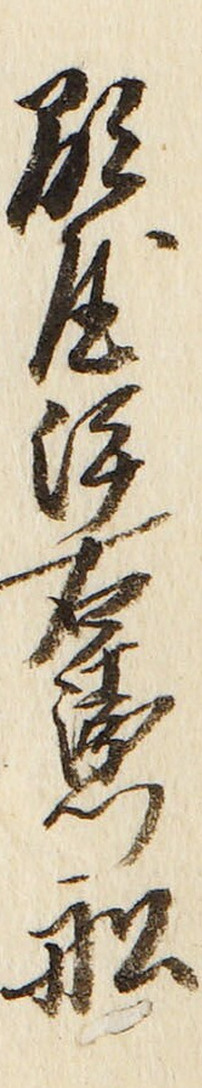顕屋伊右衛門船
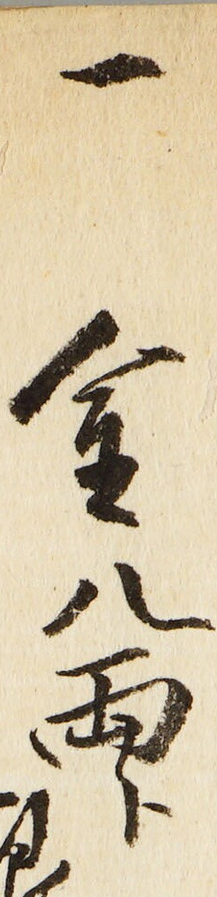一金八両ト
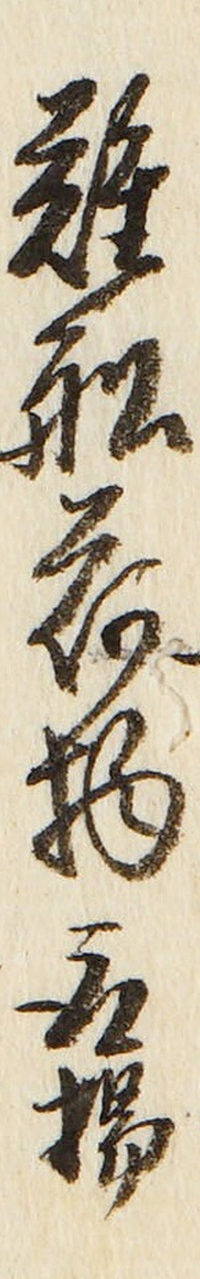難船荷物取揚
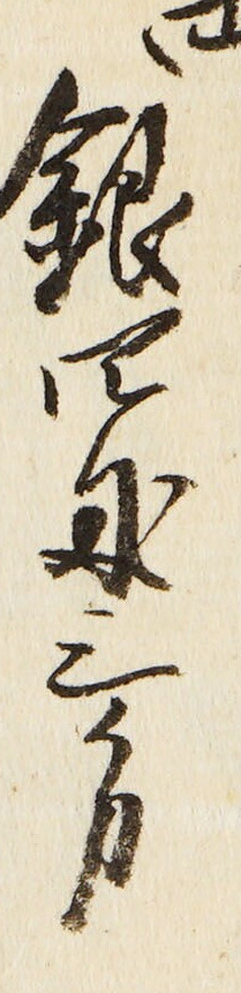銀四匁三分
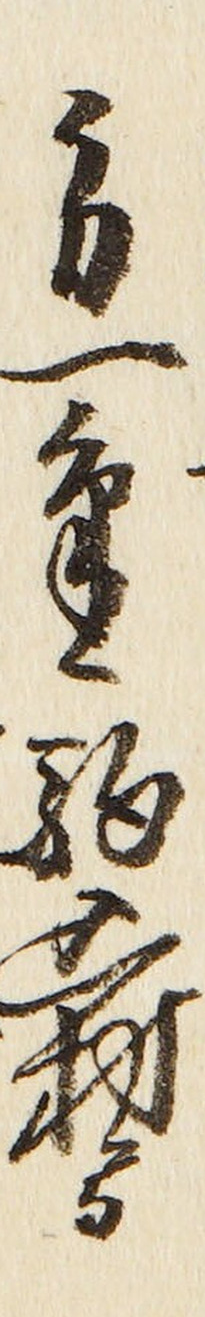方一金駒込村ニ而
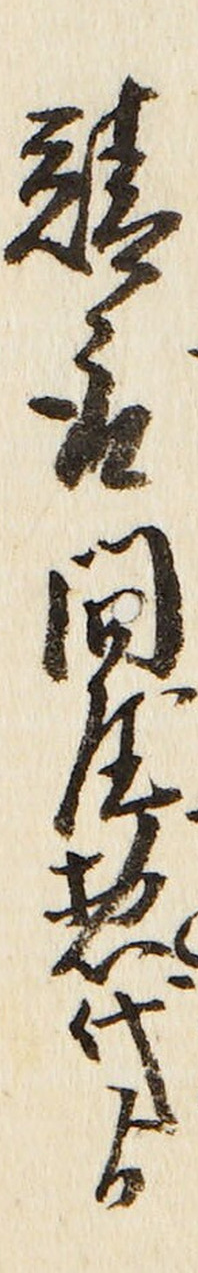請取問屋惣代ゟ
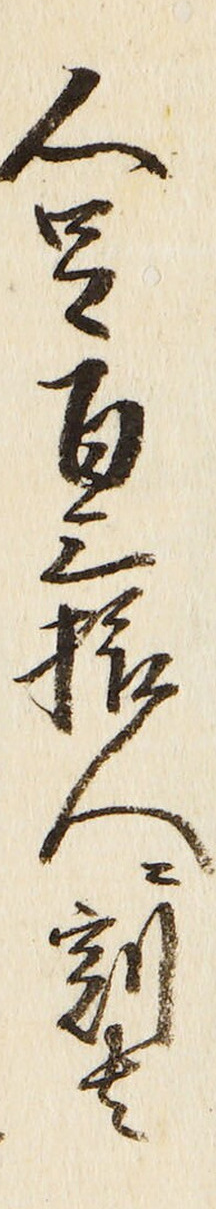人足百三拾人ニ割者
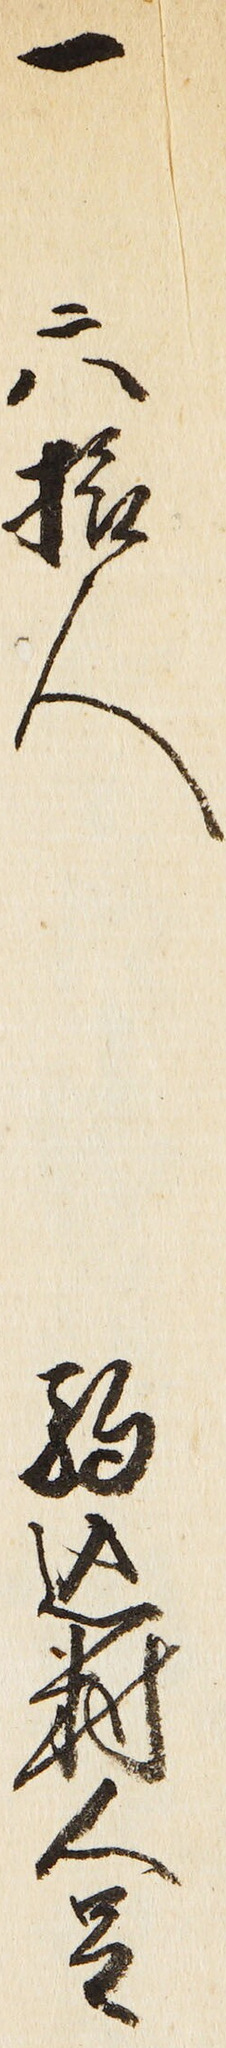一六拾人駒込村人足
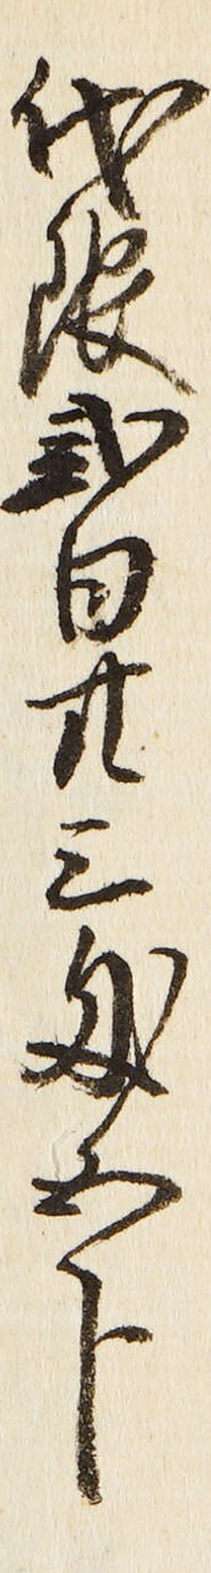代銀弐百廿三匁五歩
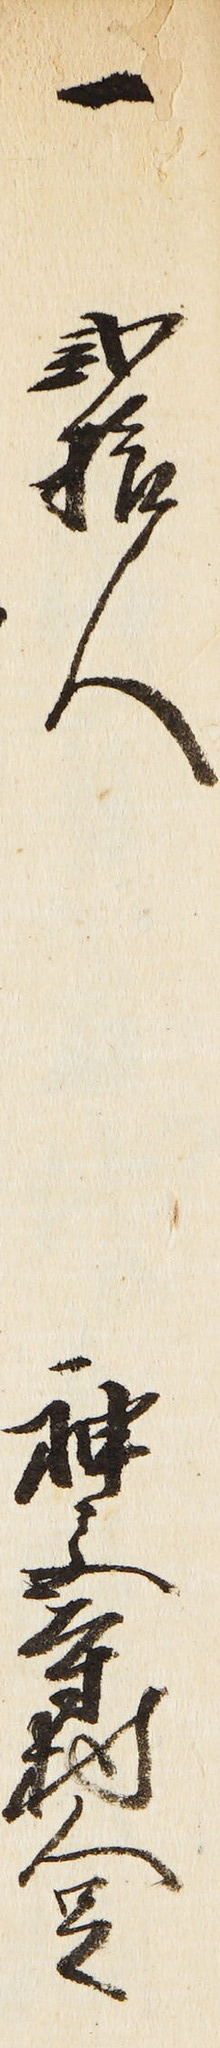一弐拾人神宮寺村人足
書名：難船一件記録
